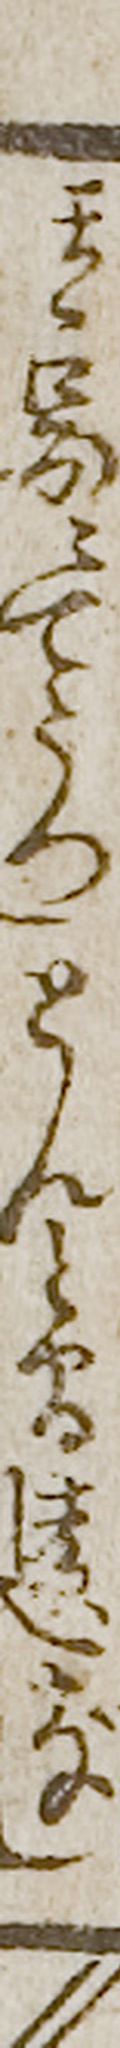其図上にてうつしとんと間違なし
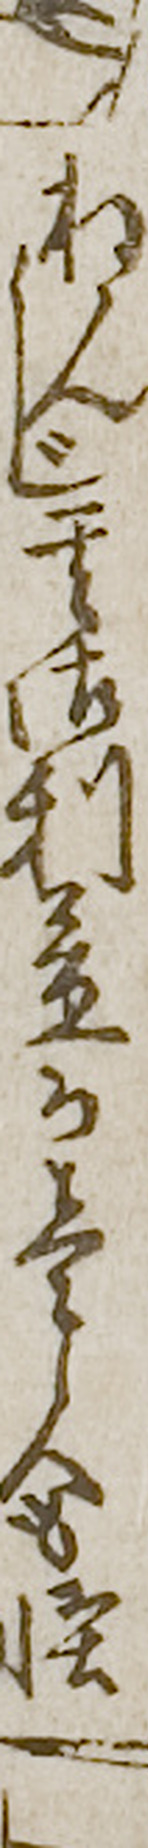ねんじ其御利益か壱人も怪
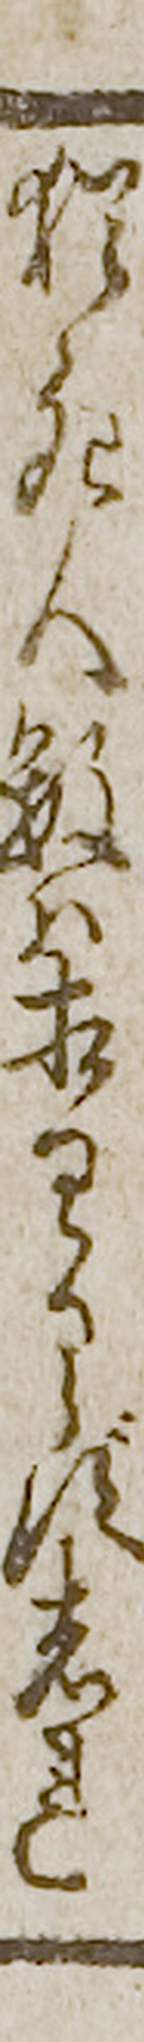猶死人数は相わからずしれ
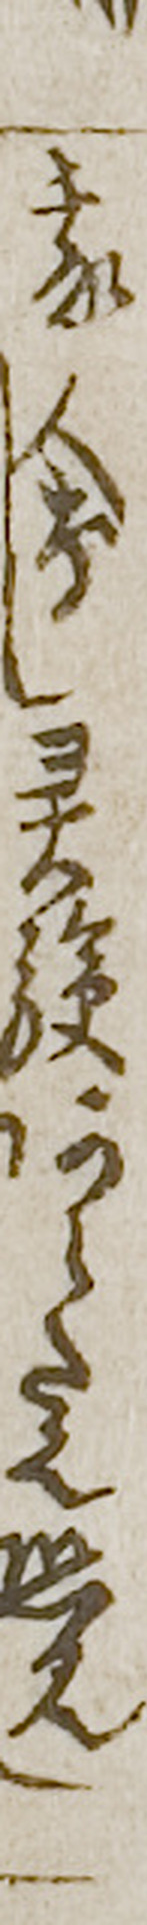我人なし霊験あらた也恐るへし
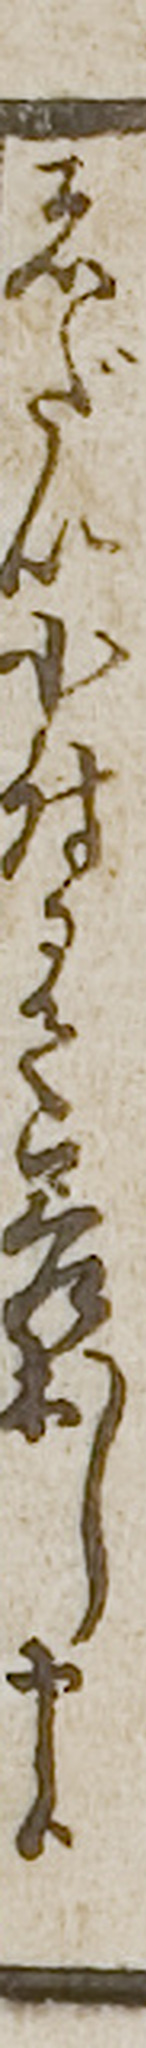しだい小付にて差出し申候
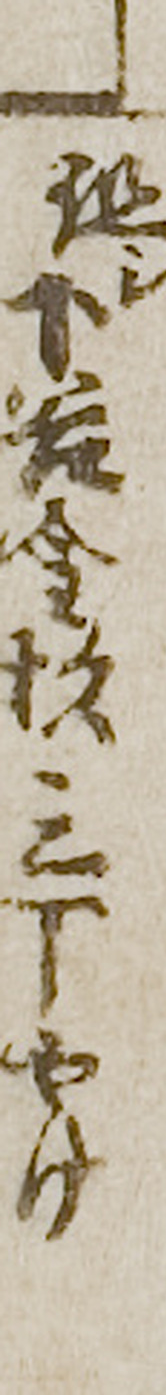但し下谷金杉三丁やけ
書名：東都珍事実録咄
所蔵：東京大学総合図書館 General Library in the University of Tokyo, JAPAN
